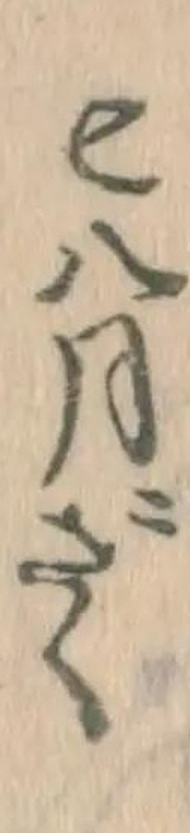七八月にさく
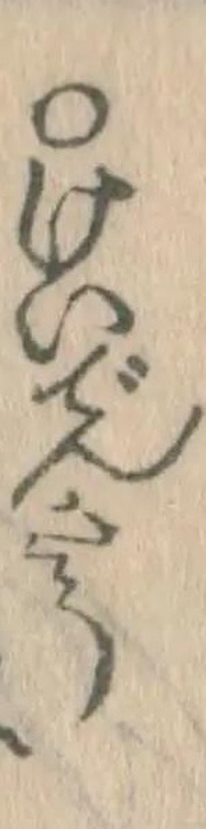〇けいでんさう
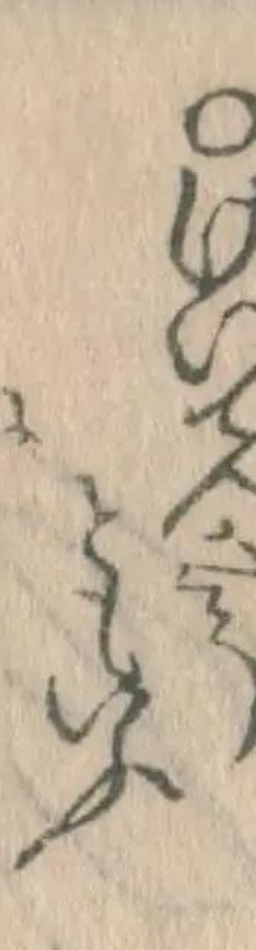ともいふ
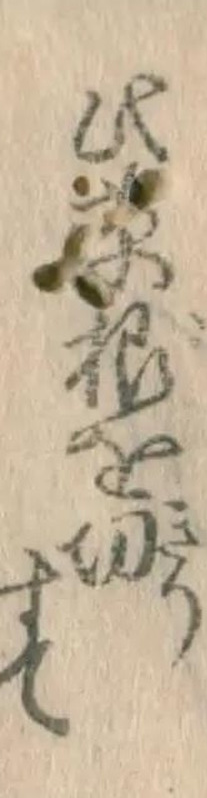此草根を切
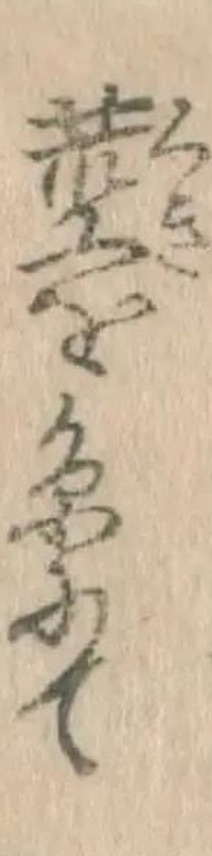茎を糸にて
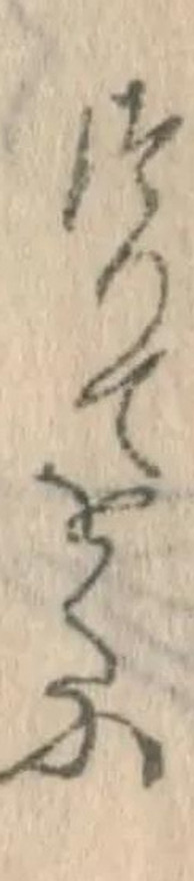つりてをくに
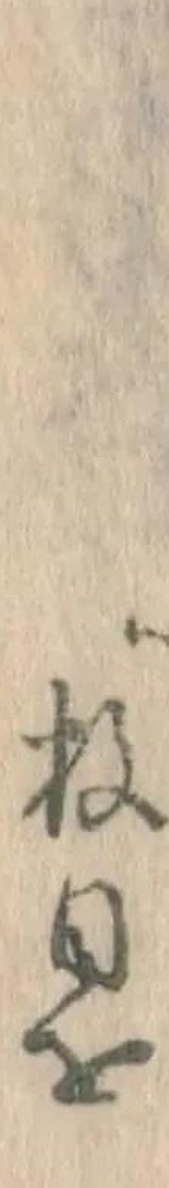数日を
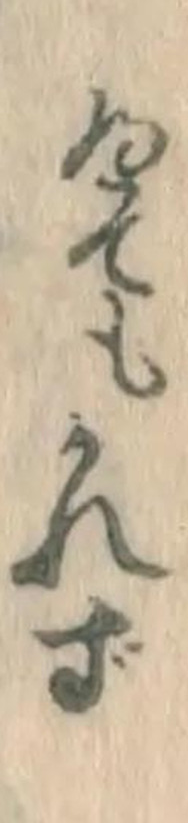へてもかれず

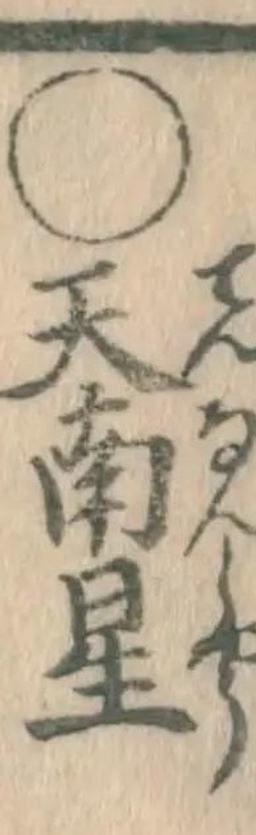〇天南星
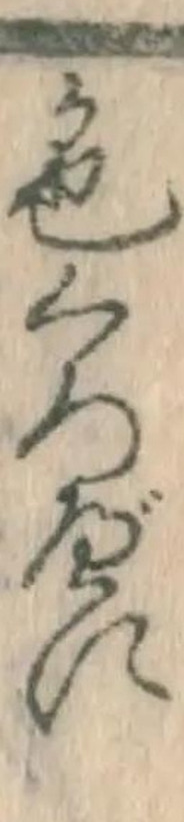色くろべに
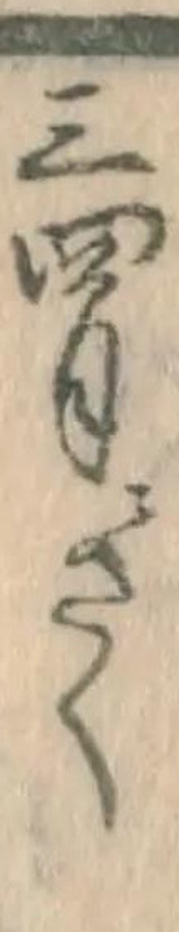三四月にさく
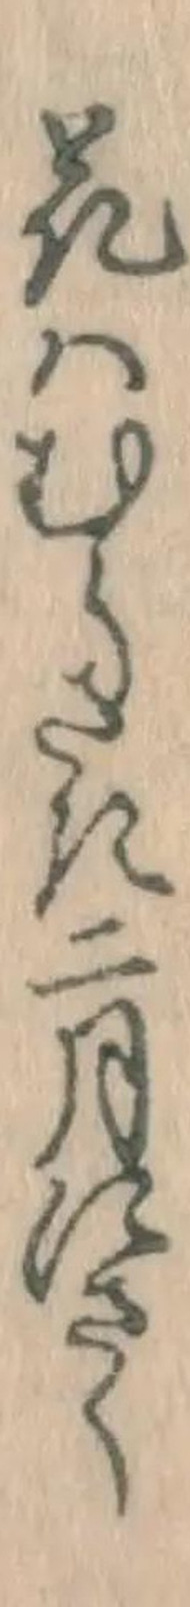花はむらさき二月にさく
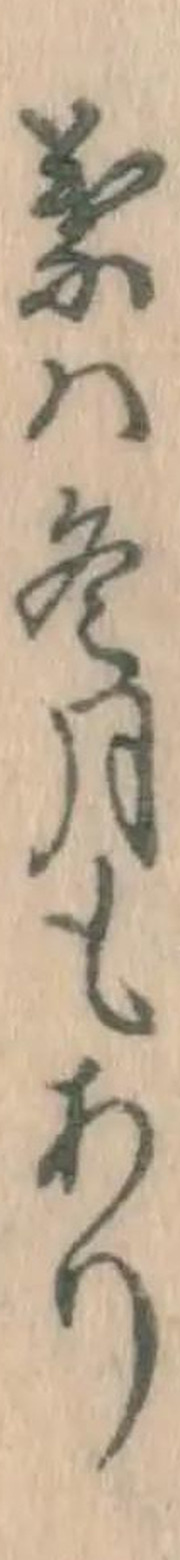葉は冬月もあり
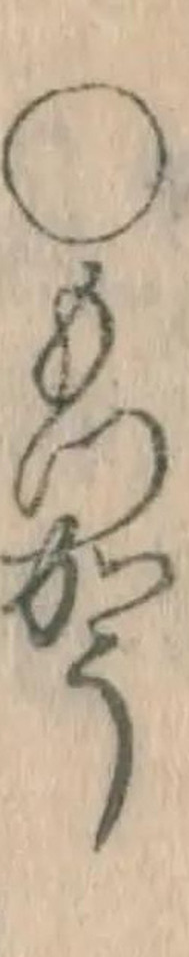〇もつかう
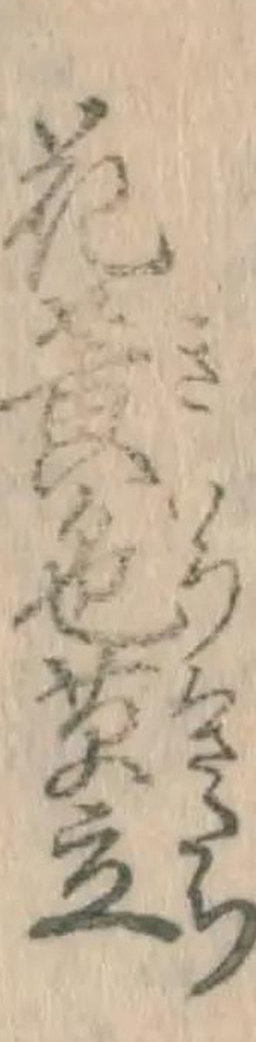花黄色草立
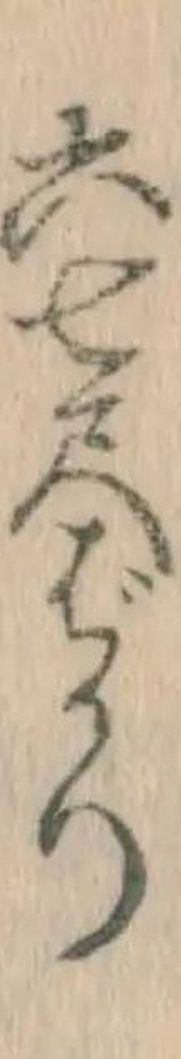六七尺ばかり
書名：艸花繪前集. [2]
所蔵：国立国会図書館 National Diet Library, JAPAN
